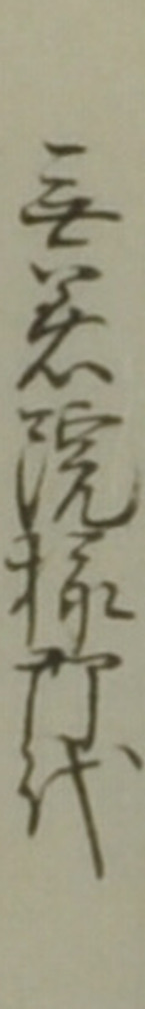無着院様御代
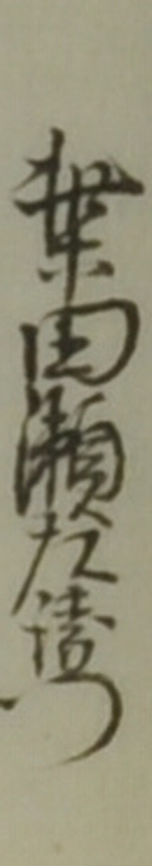柴田瀬左衛門
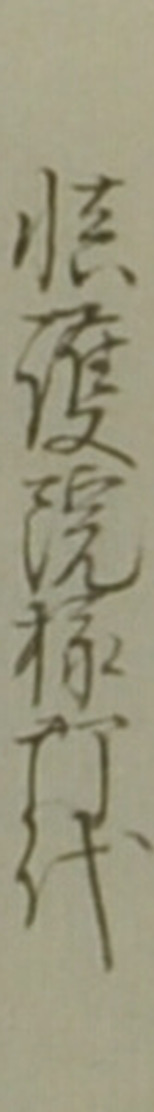慎護院様御代
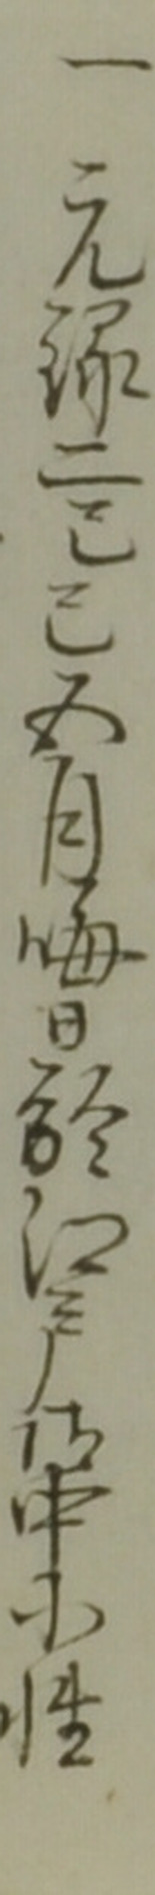一元禄二己巳五月晦日於江戸御中小性
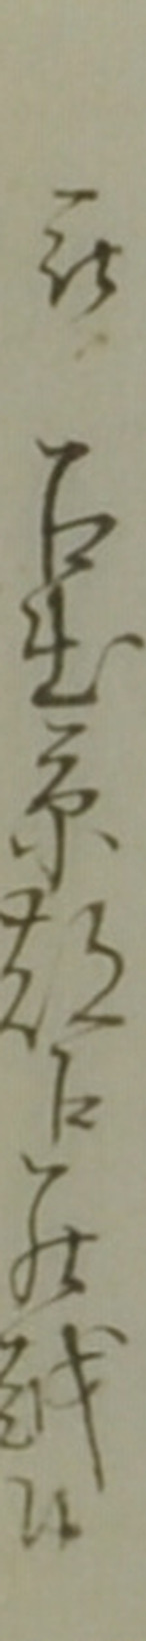被召出京都江罷越候
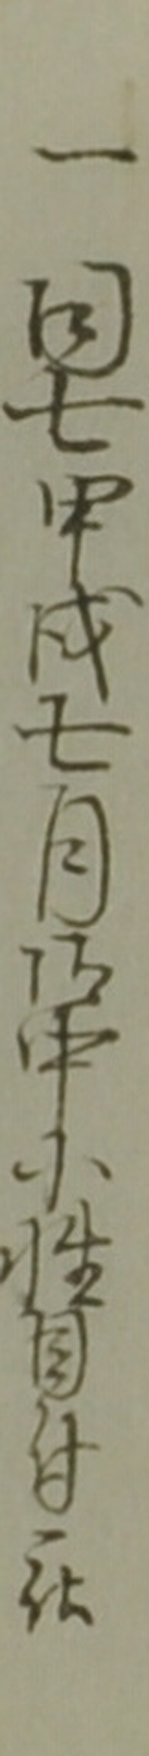一同七甲戌七月御中小性目付被
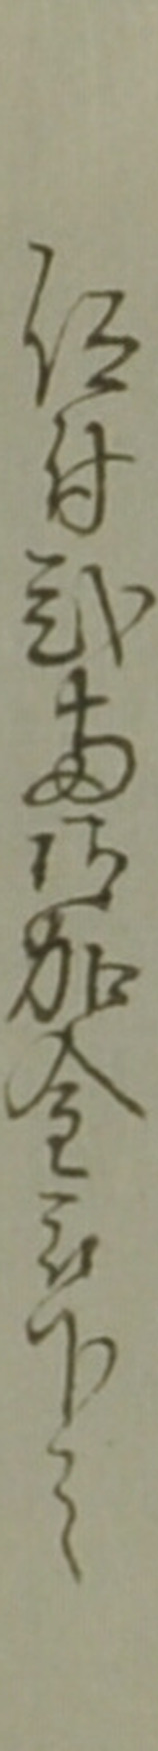仰付弐両御加金被下之
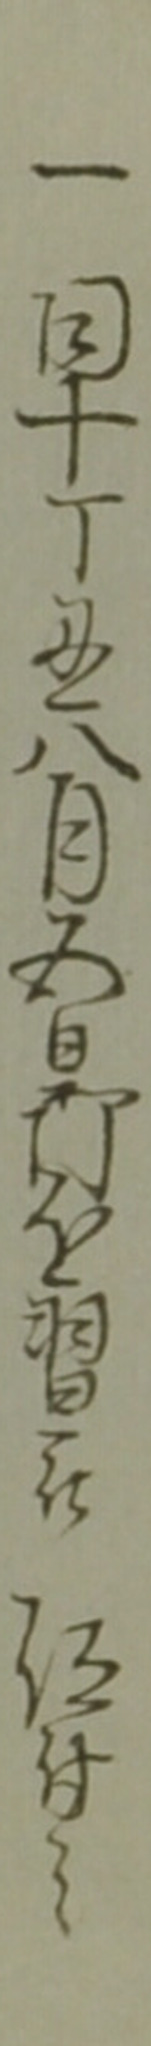一同十丁丑八月五月御近習被仰付之
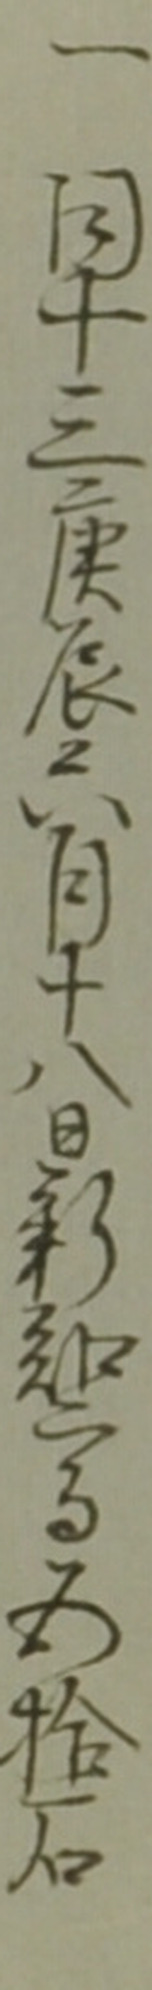一同十三庚辰六月十八日新知高五拾石
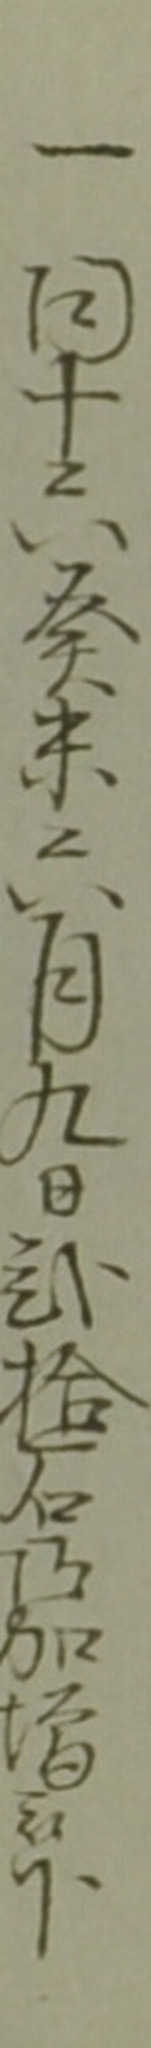一同十六癸未六月九日弐拾石御加増被下
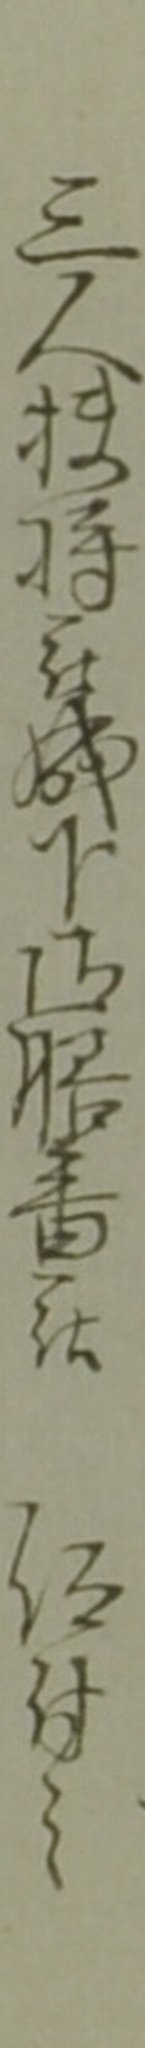三人扶持被成下御膳番被仰付之
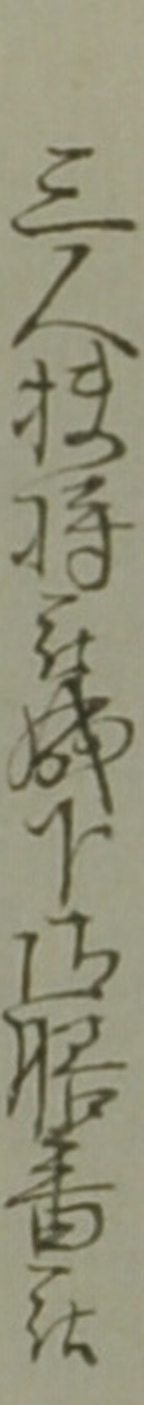三人扶持被成下御膳番被仰付之
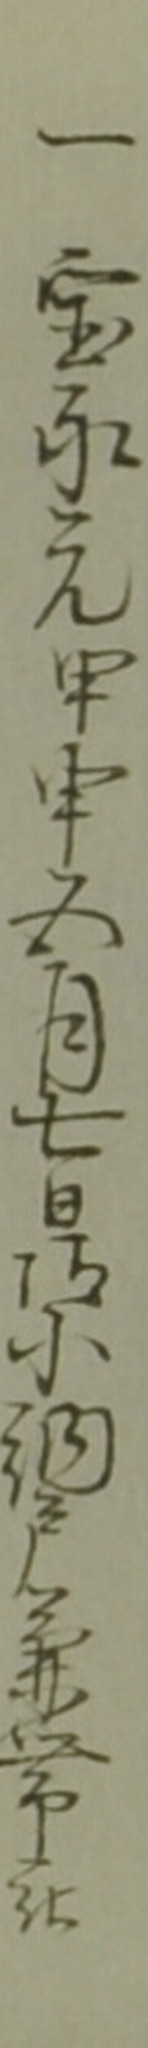一宝永元甲申五月七日御小納戸兼帯被
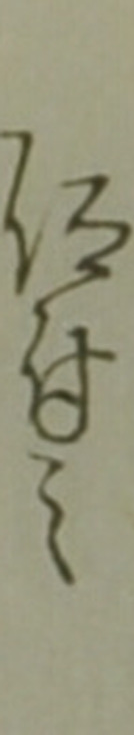仰付之
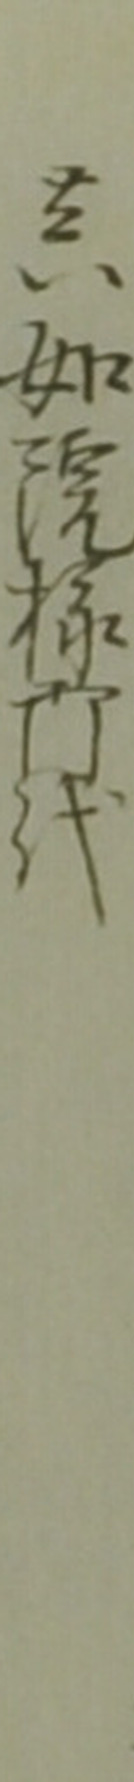真如院様御代
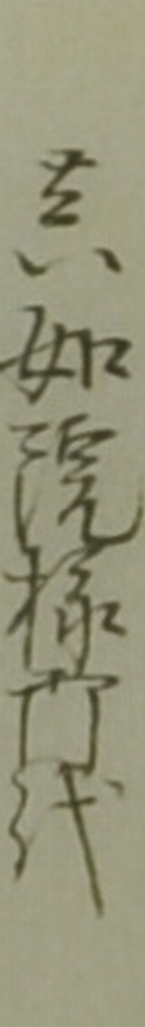真如院様御代
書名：給人諸士勤仕録（三）
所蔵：伊那市立高遠町図書館・合同会社AMANE
